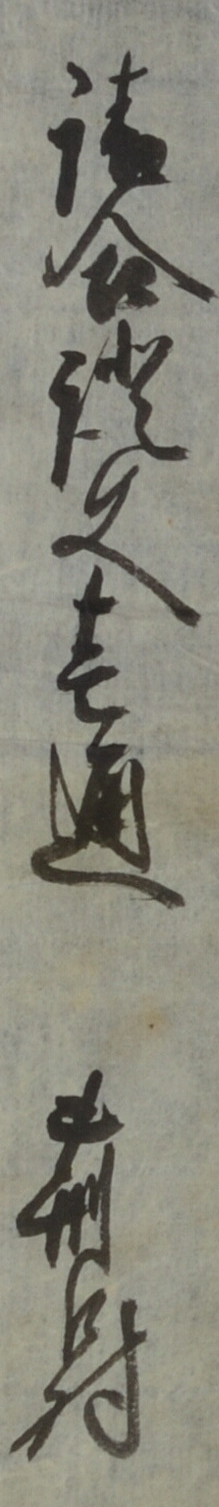請合証文壱通荊口村
